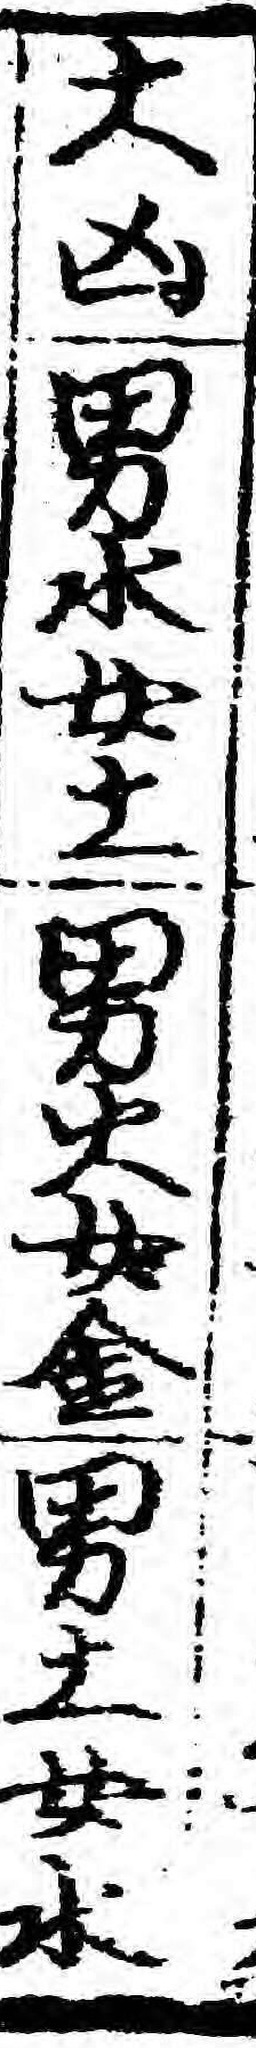大凶男水女土男火女金男土女水
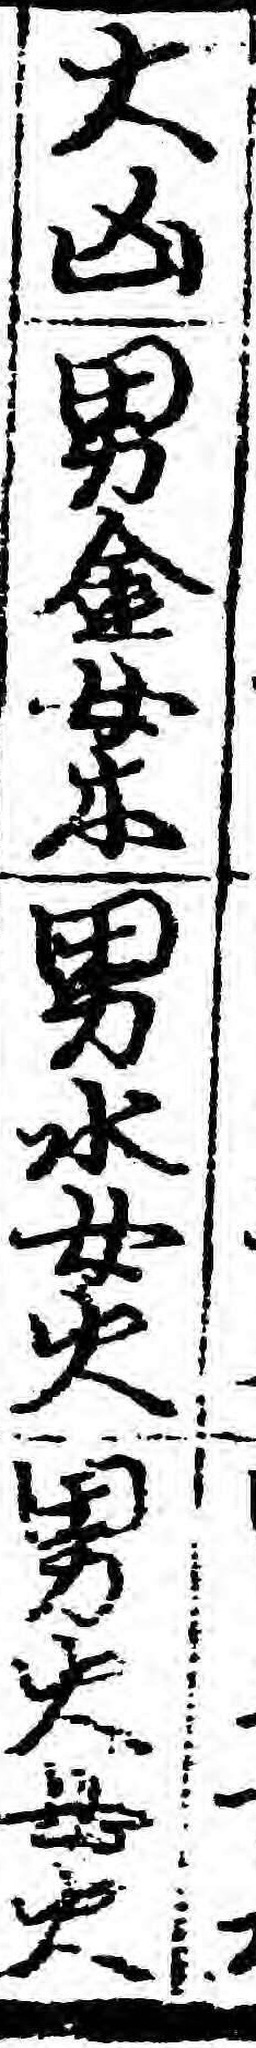大凶男金女木男水女火男火女火
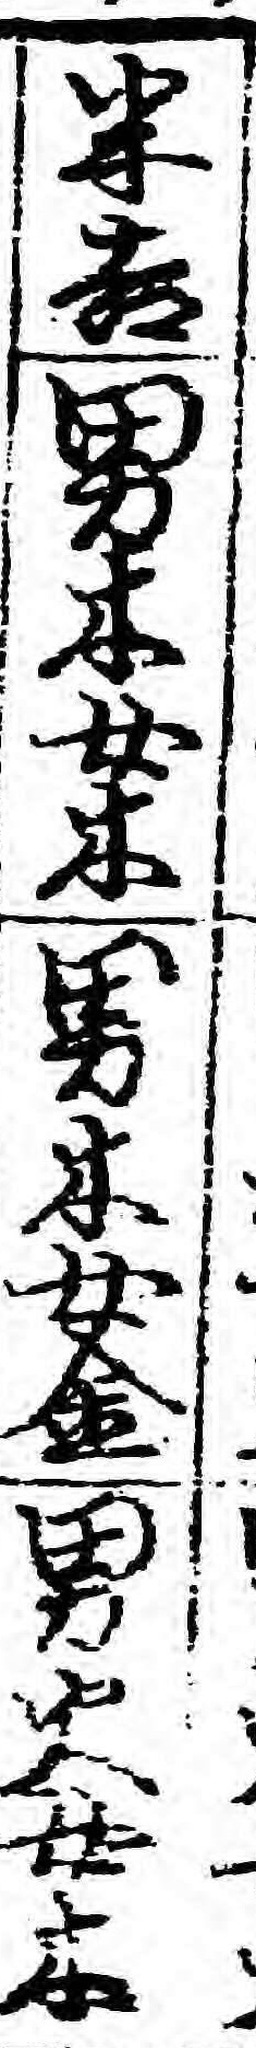半吉男木女木男木女金男火女木
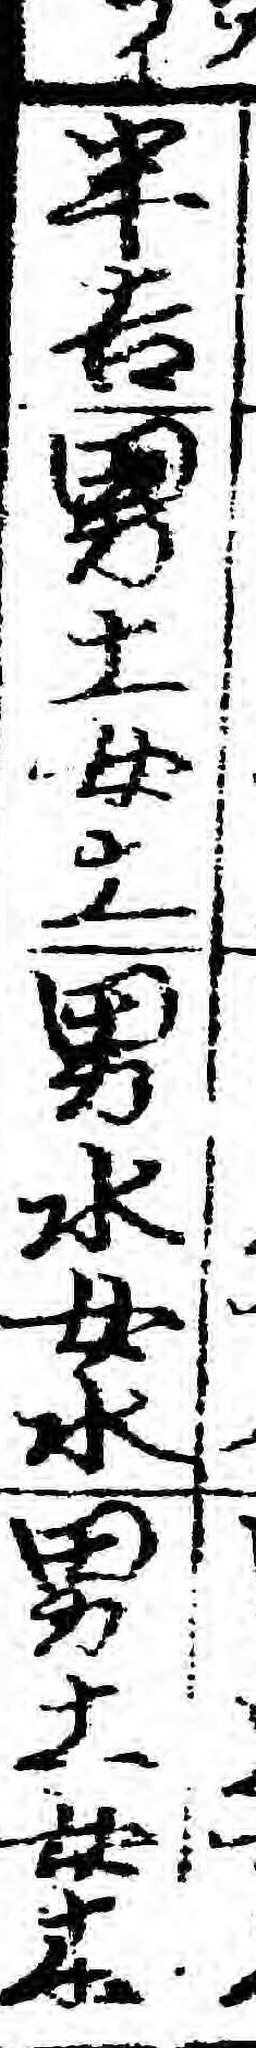半吉男土女土男水女水男土女木
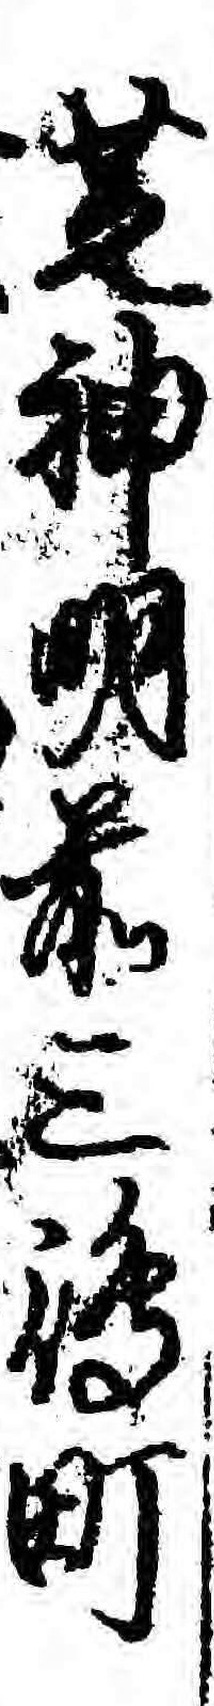芝神明前三島町
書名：頭書和歌注譯／壽賀多百人一首小倉錦
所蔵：国文学研究資料館
